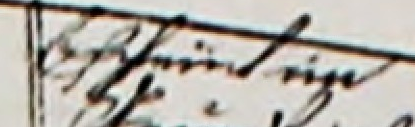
Erscheint im
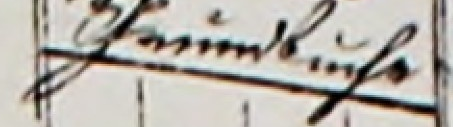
Grundbuche
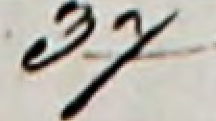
37
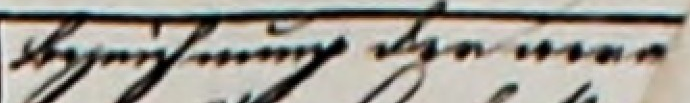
Bezeichnung der verweischen
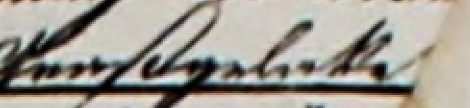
Genßgelake
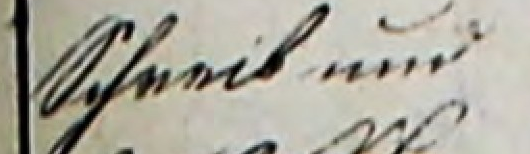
Schreib und
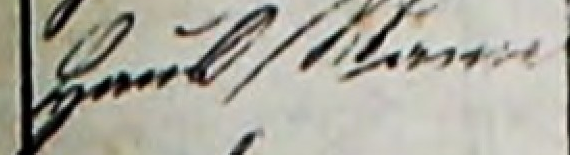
Haus Name
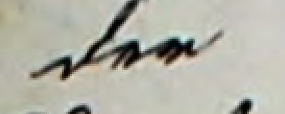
den
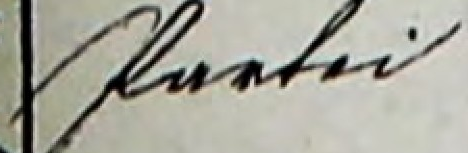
Partei
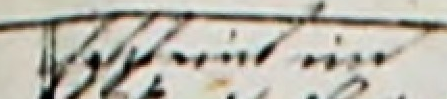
Erscheint im
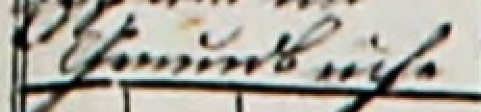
Grundbuche
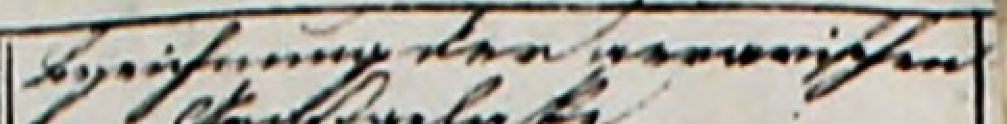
Bezeichnung der verweischen
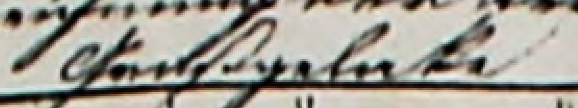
Genßgelake
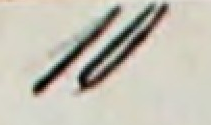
10
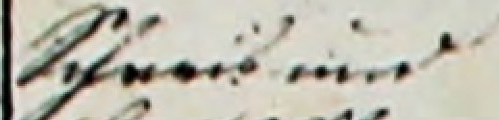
Schreib und
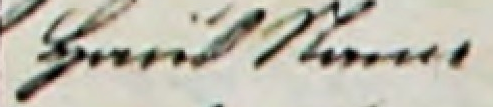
Haus Name
